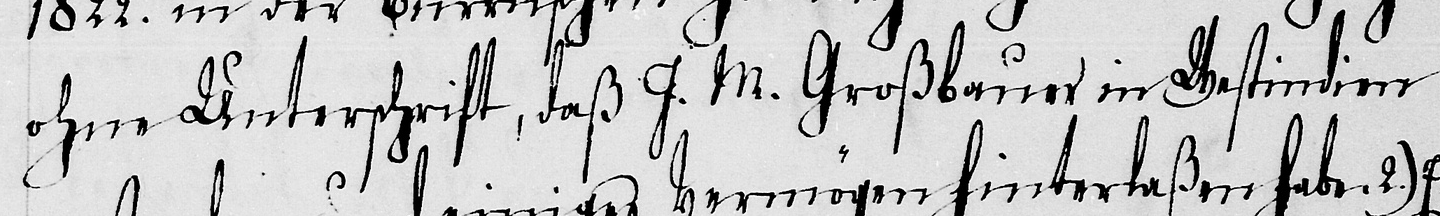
ohne Unterschrift, daß J. M. Großbauer in Westindien
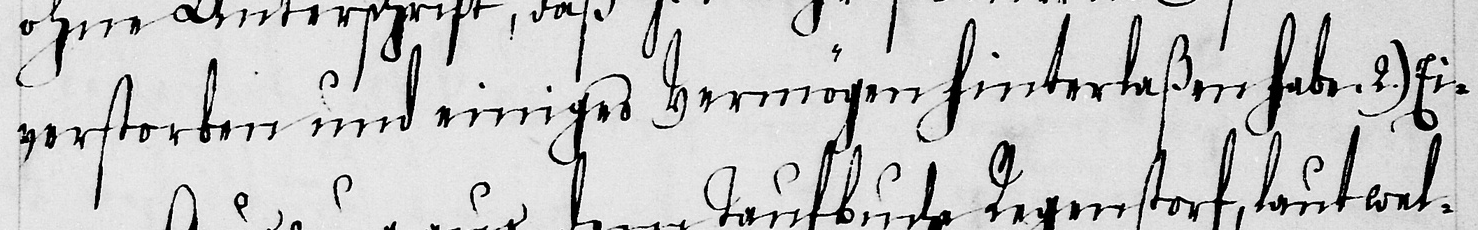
verstorben und einiges Vermögen hinterlaßen habe. 2.) E¬
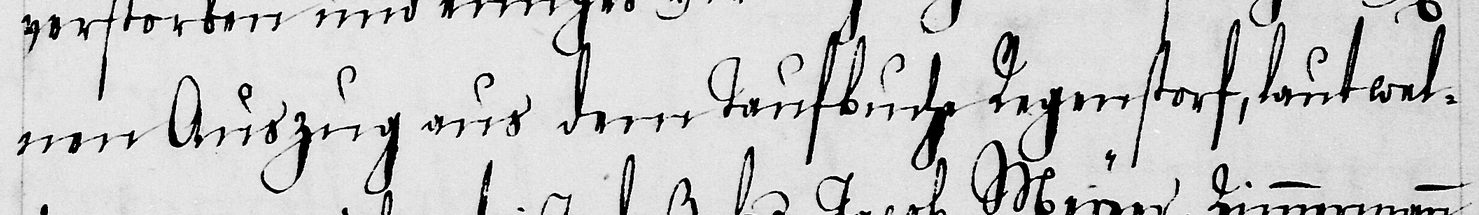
inen Auszug aus dem Taufbuche Regenstorf, laut wel¬
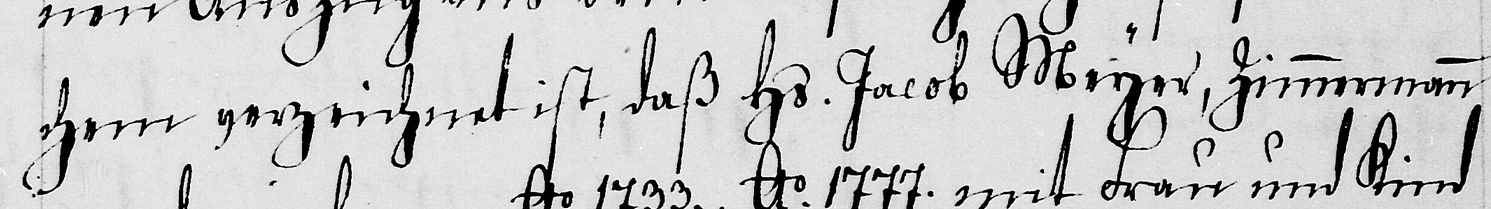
chem verzeichnet ist, daß Hs. Jacob Meyer, Zimmermann
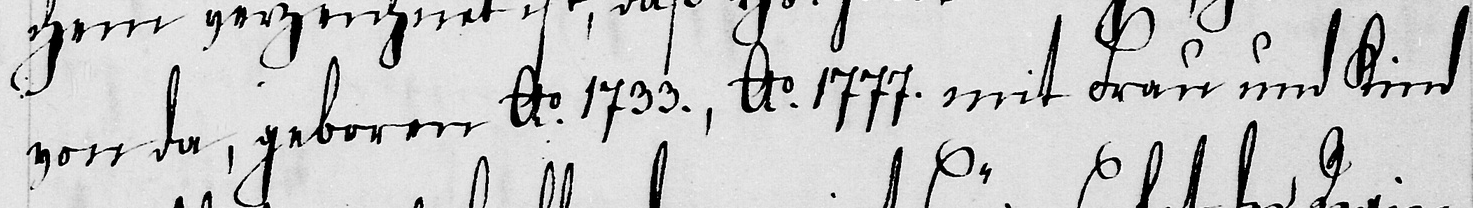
von da, geboren Ao. 1733., Ao. 1777. mit Frau und Kind
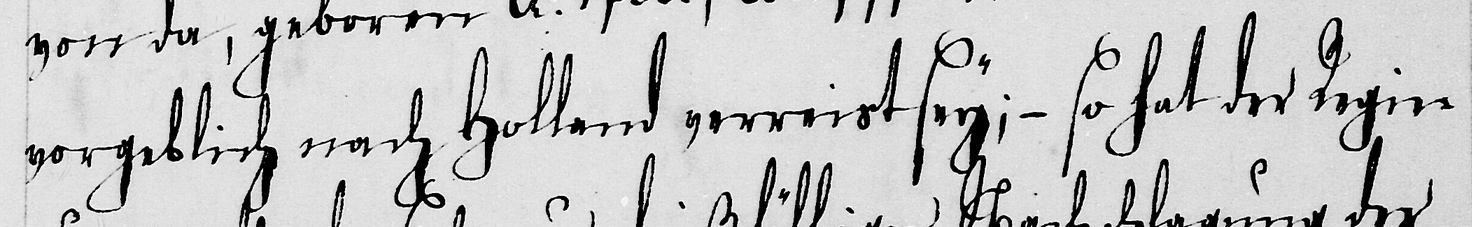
vorgeblich nach Holland verreist sey; – so hat der
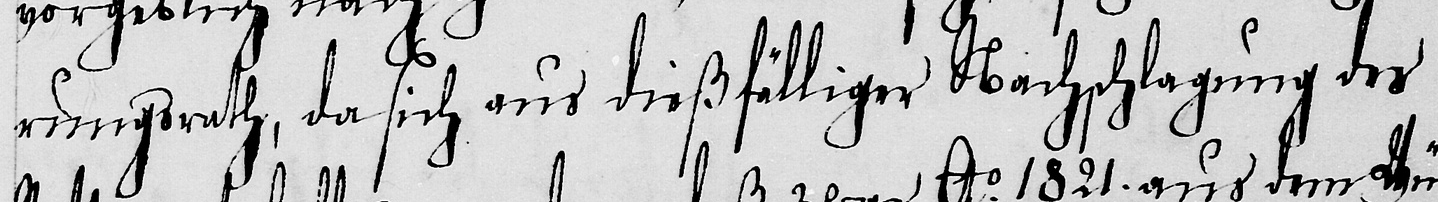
erungsrath, da sich aus dießfälliger Nachschlagung des
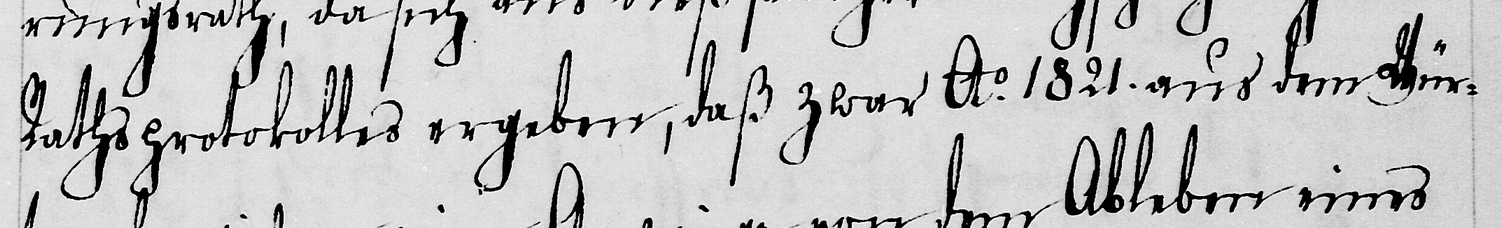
Rathsprotokolles ergeben, daß zwar Ao. 1821. aus dem Wür¬
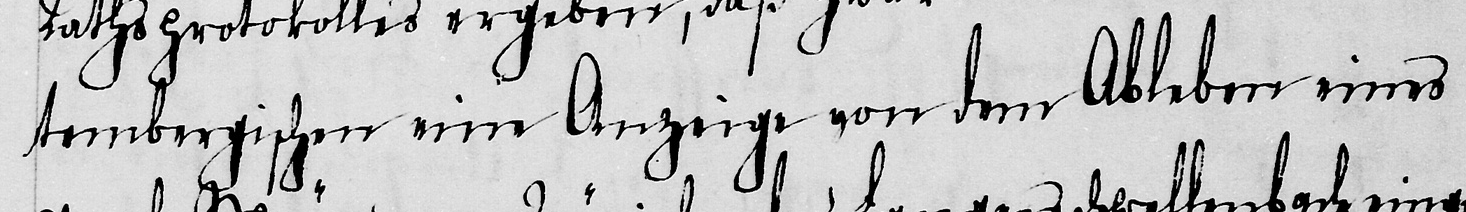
tembergischen eine Anzeige von dem Ableben eines
